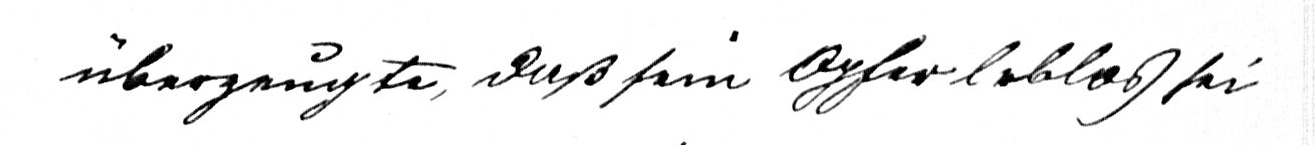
überzeugte, daß sein Opfer leblos sei
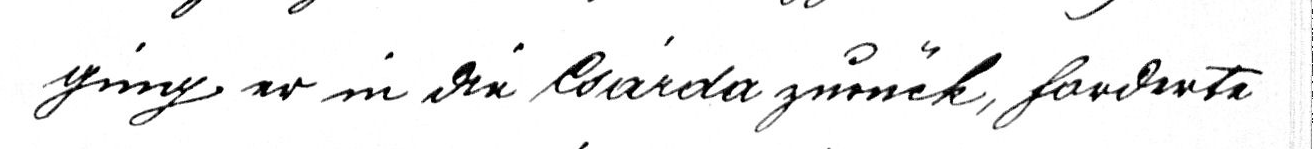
ging er in die Csárda zurück, forderte
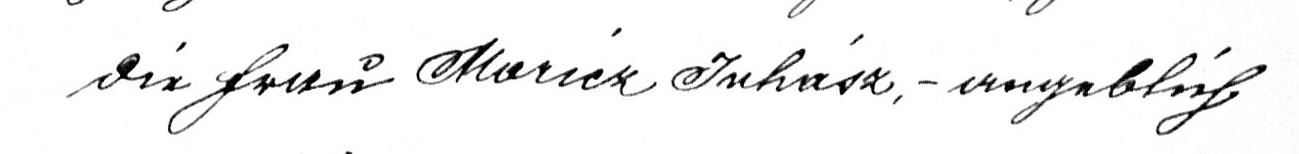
die Frau Moricz Inhász, - angeblich
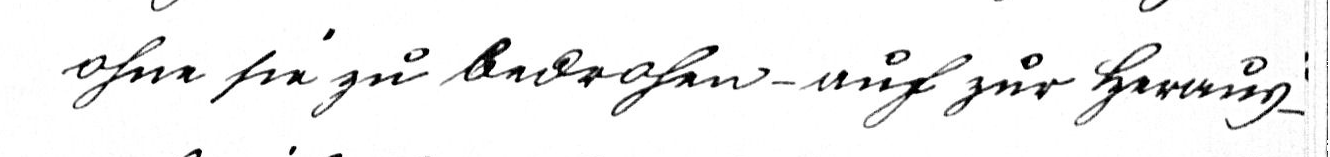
ohne sie zu bedrohen - auf zur heraus¬
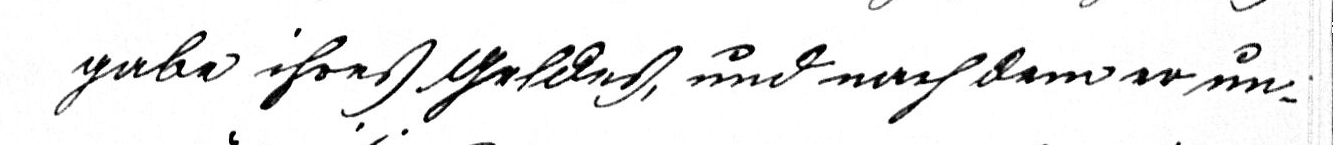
gabe ihres Geldes, und nach dem er un¬
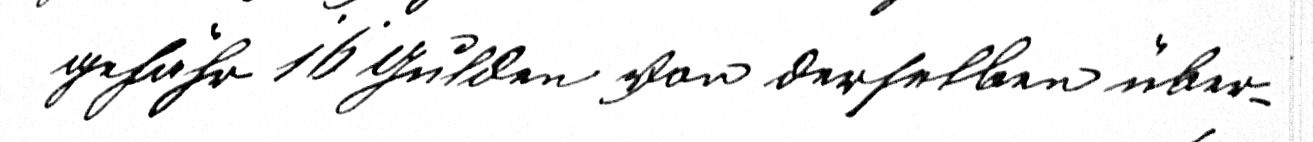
gefähr 16 Gulden von derselben über¬
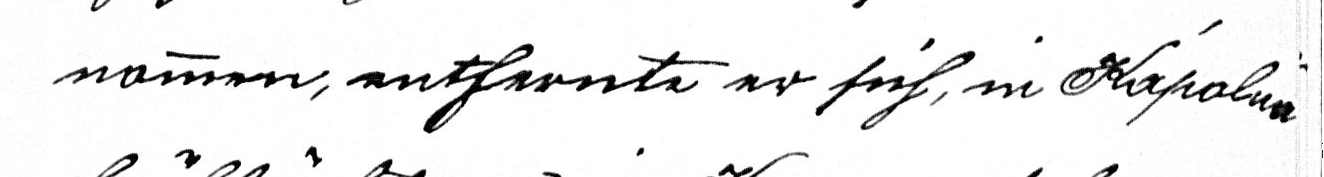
nommen, entfernte er sich, in Kápolna
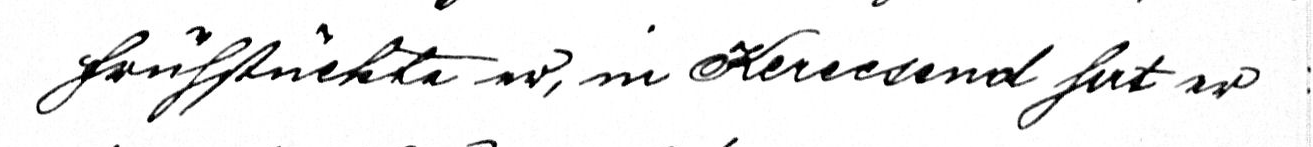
frühstückte er, in Kerecsend hat er
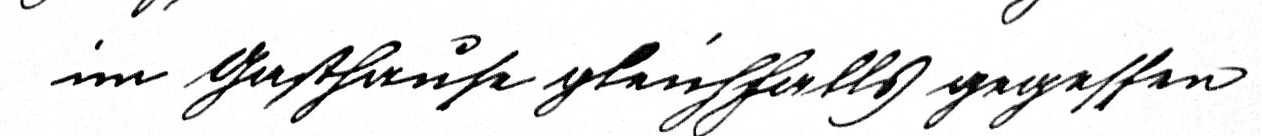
im Gasthause gleichfalls gegessen
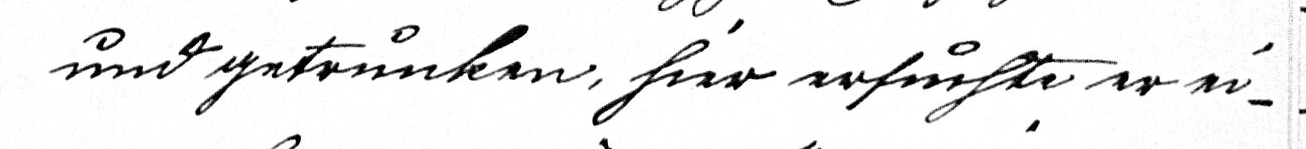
und getrunken, hier ersuchte er ei¬
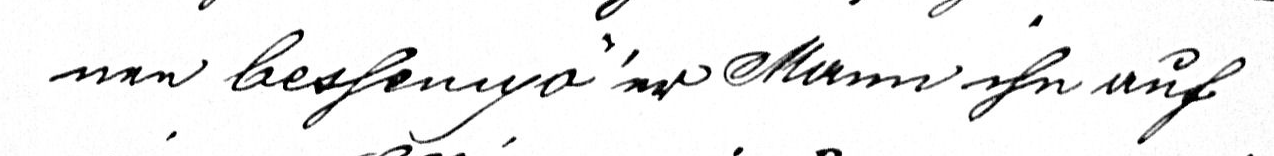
nen bessemyö'er Mann ihn auf
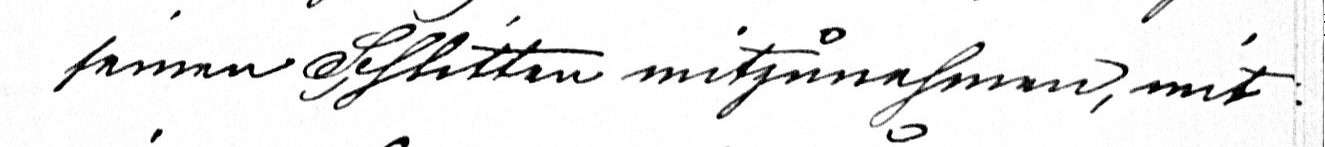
seinen Schlitten mitzunehmen, mit
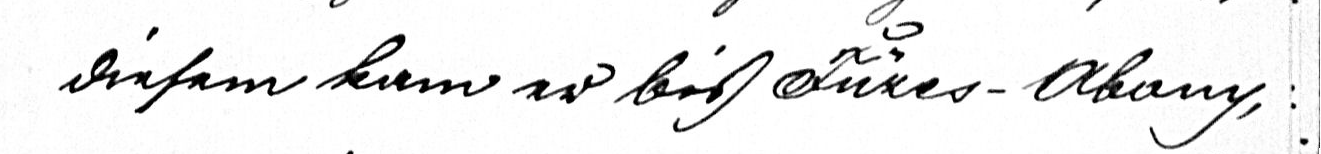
diesem kam er bis Füzes - Abony,
